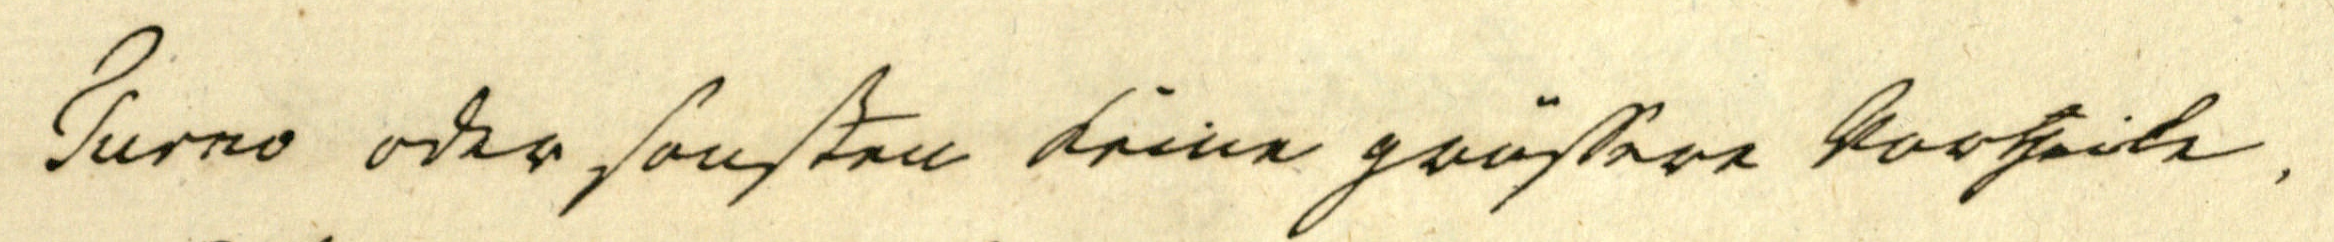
Turno oder sonsten keine grössere Vortheile
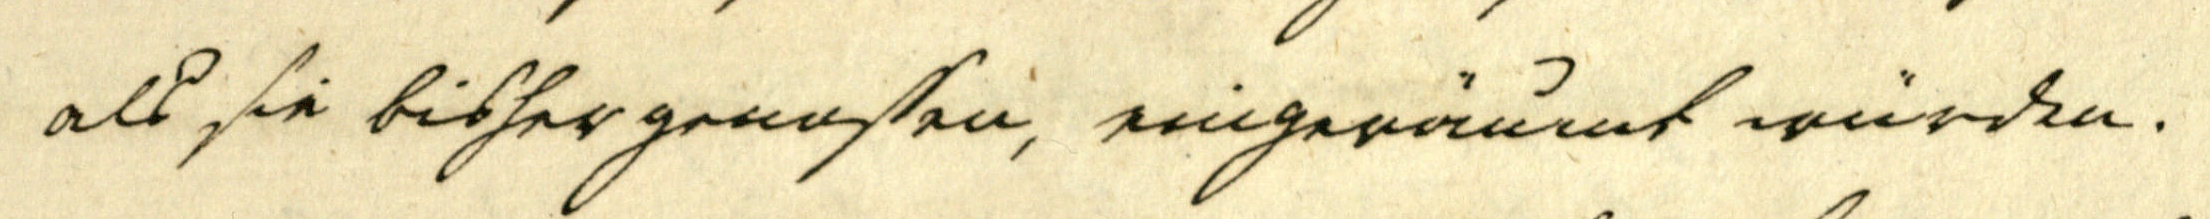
als die bisher genossen, eingeräumt würden.
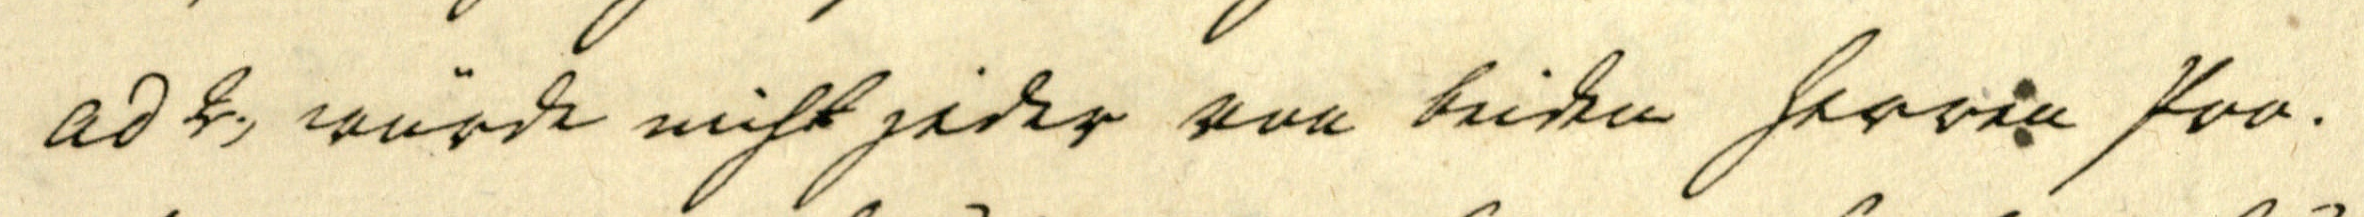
ad 2., würde nicht jeder von beiden herren Pro
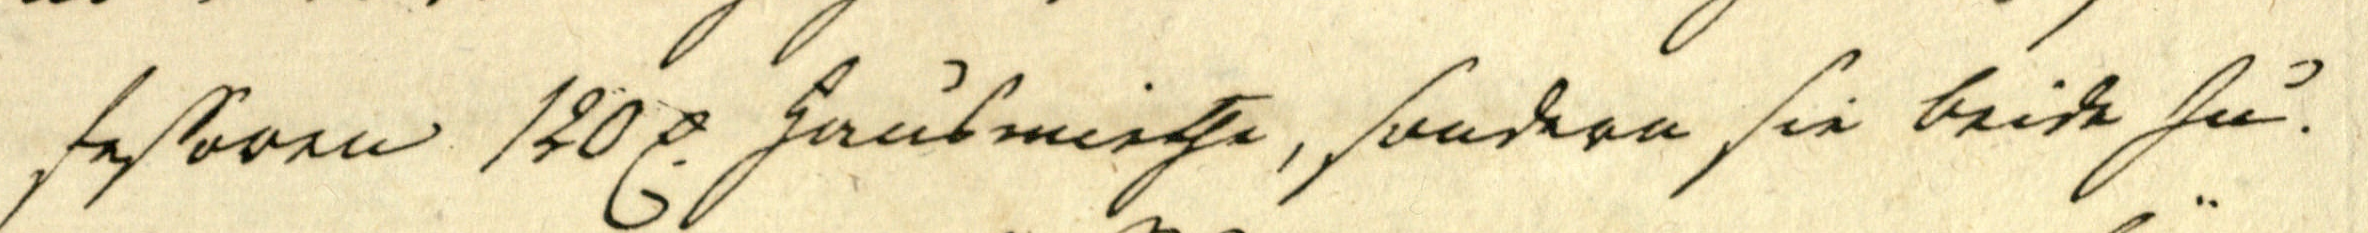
fessoren 120 l. Hausmiethe, sondern sie beide zu¬
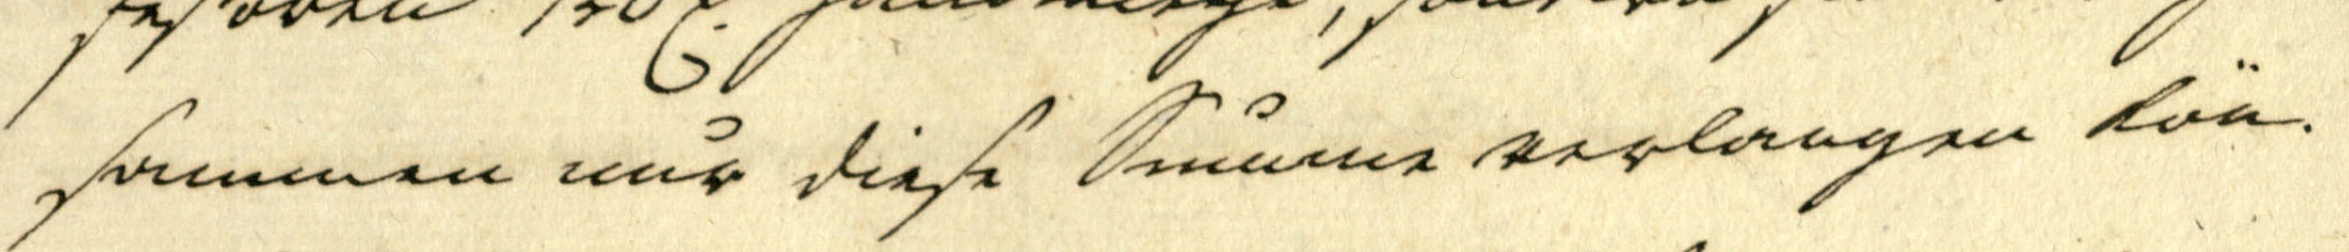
sammen nur diese Summe verlangen kön¬
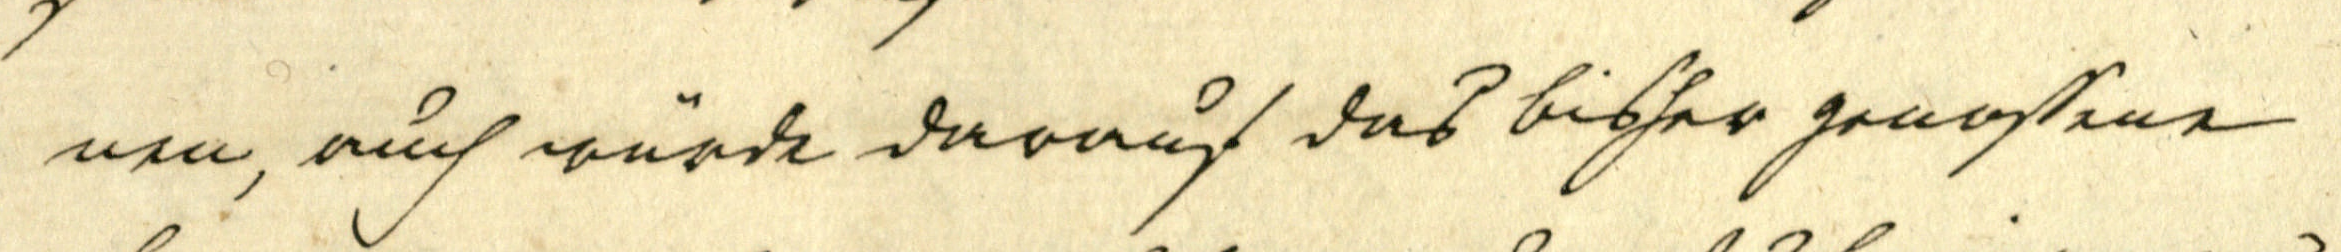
nen, auch würde darauf das bisher genossene
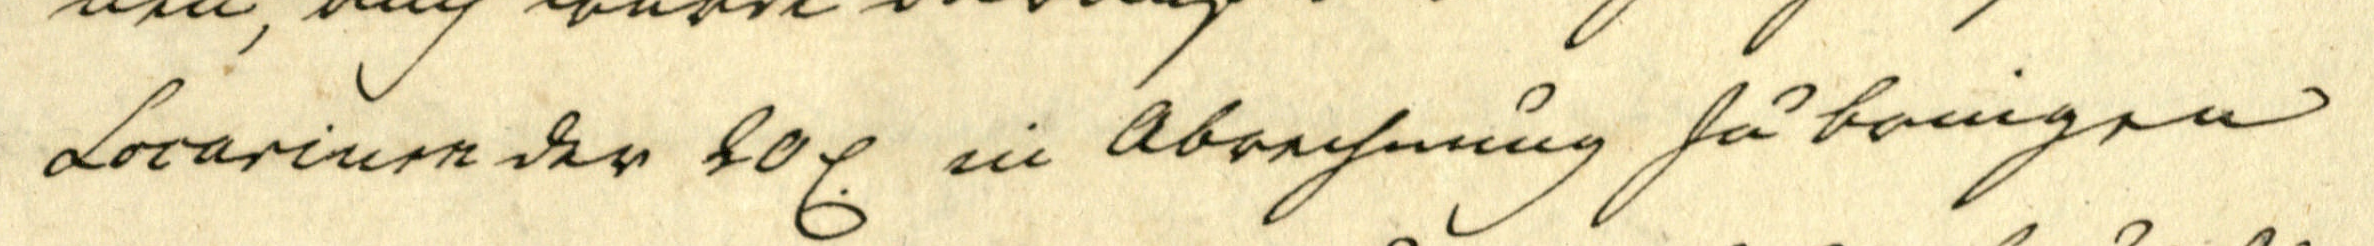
Locarium der 20 l. in Abrechnung zu bringen
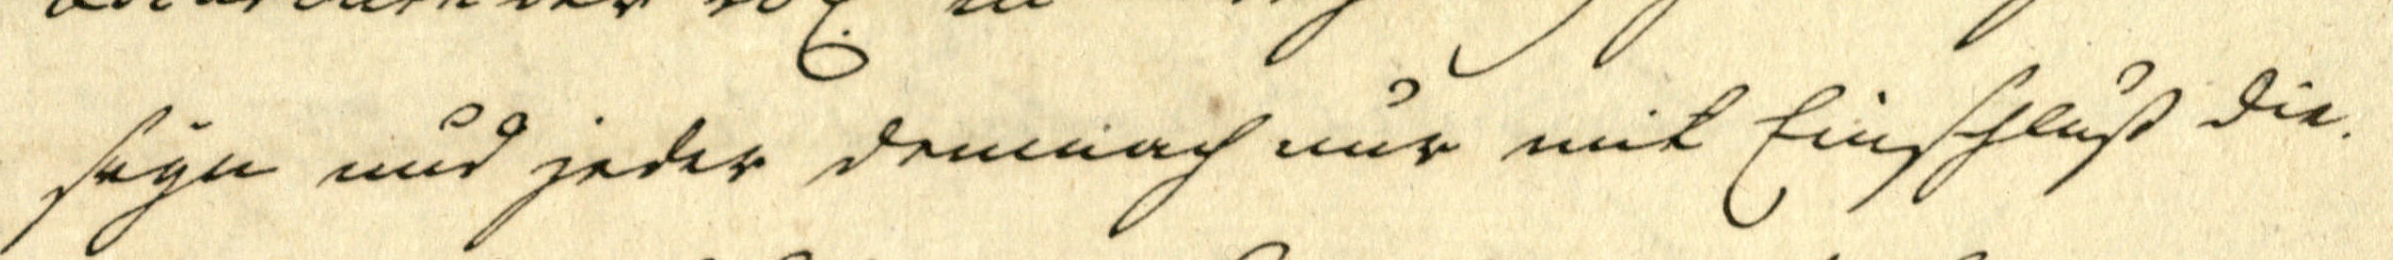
seÿn und jeder demnach nur mit Einschluß die¬
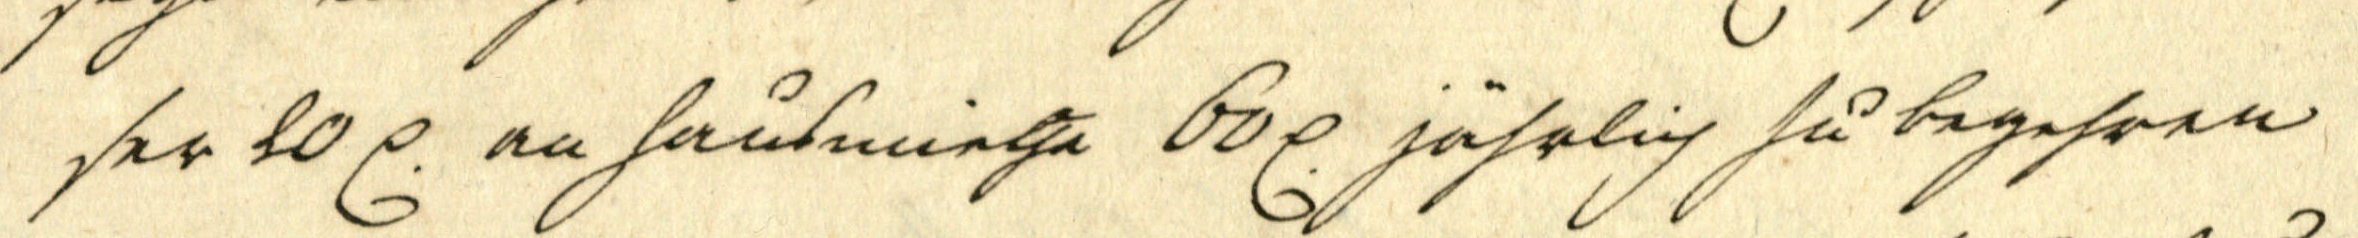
ser 20 l. an hausmiethe 60 l. jährlich zu begehren
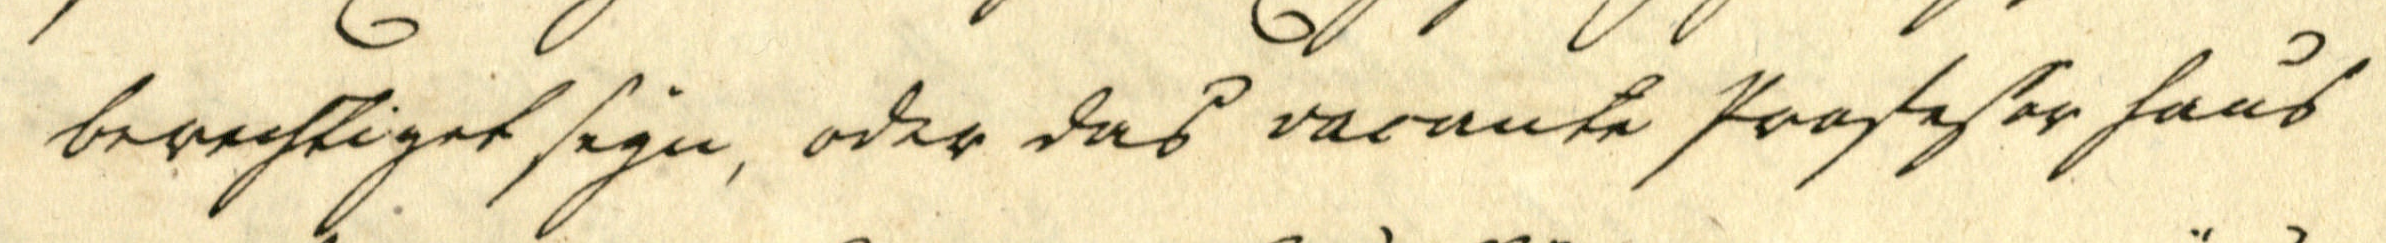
berechtiget seÿn, oder das vacante Professorhaus
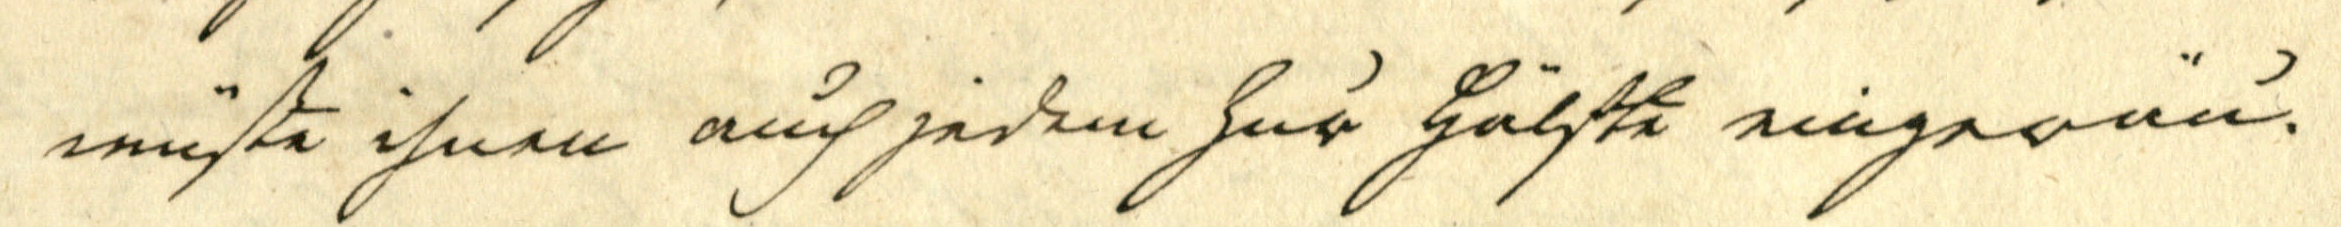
müste ihnen auch jedem zur Hälfte eingeräu¬
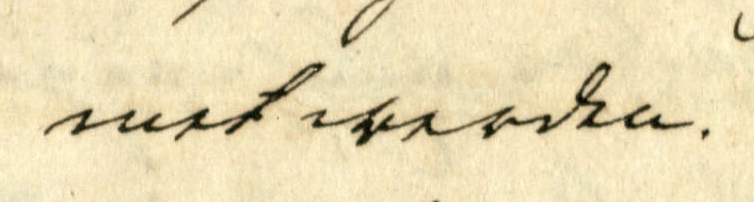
met werden.
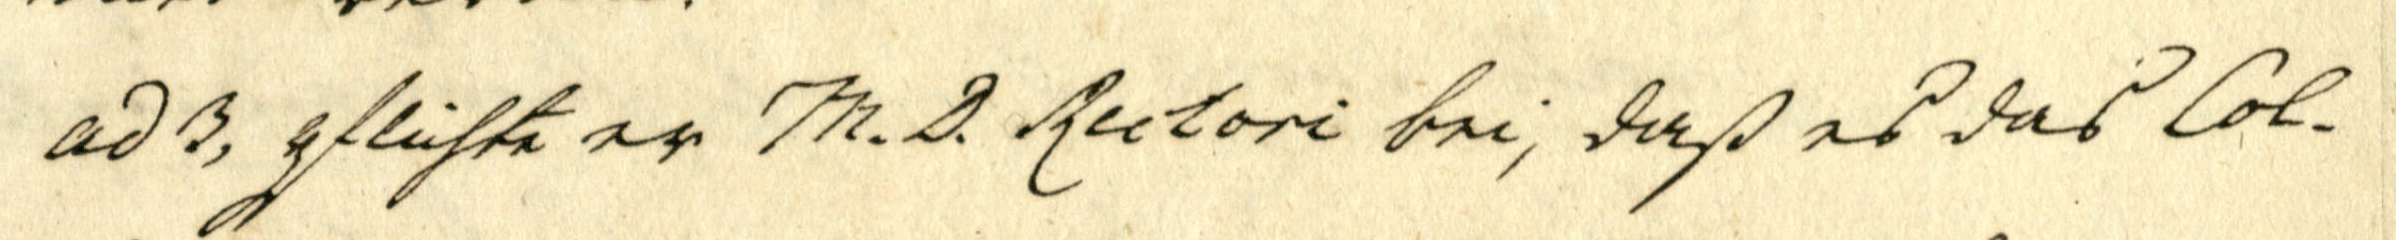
ad 3., pflichte er M. D. Rectori bei, daß es das Col¬
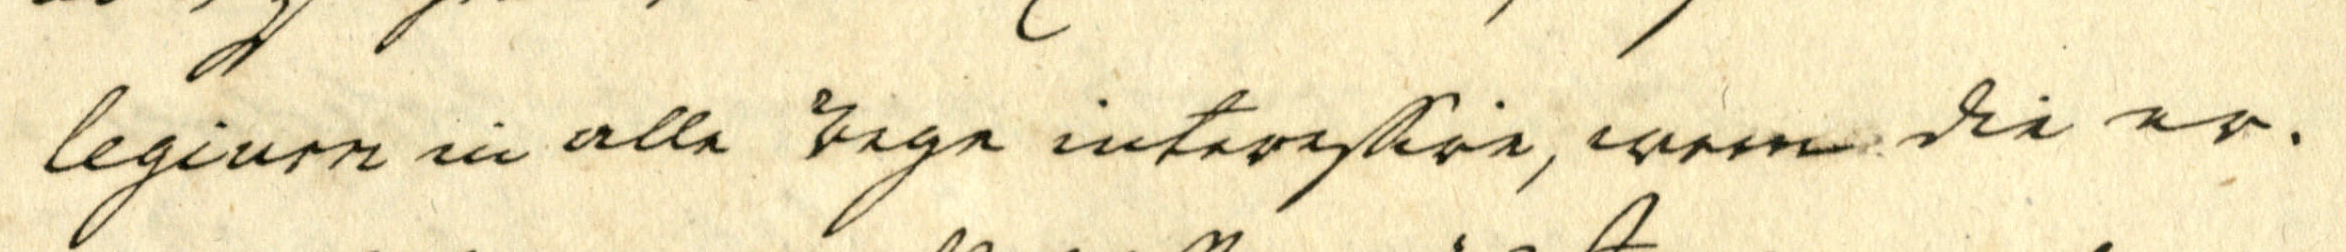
legium in alle Wege interessire, wem die er¬
